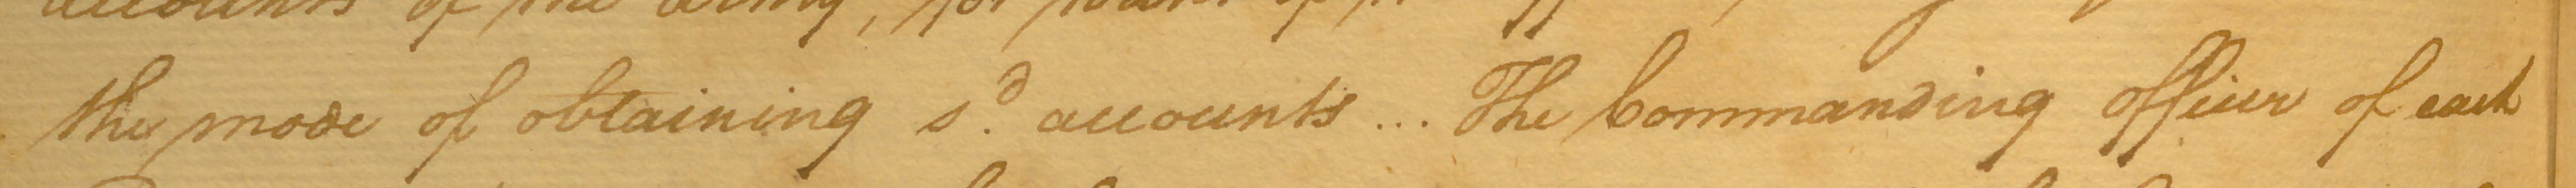the mode of obtaining s^d. accounts... The Commanding officer of each
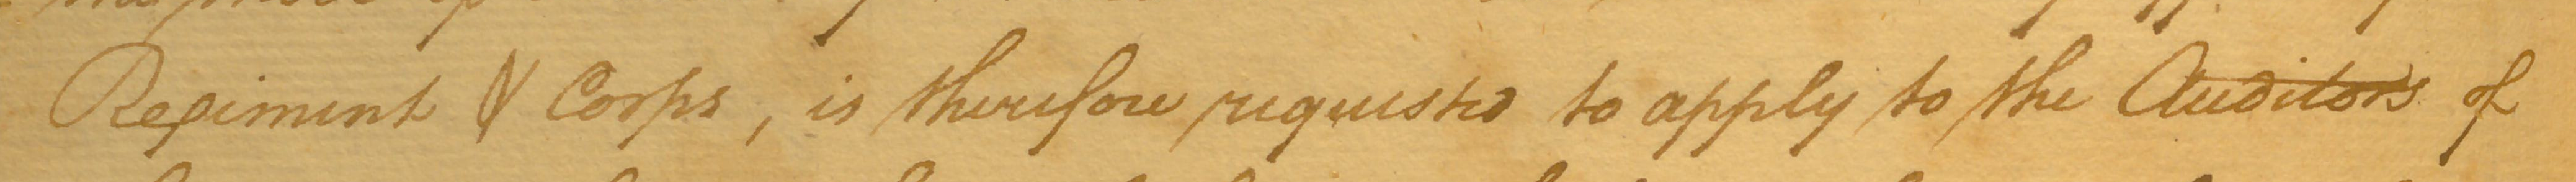Regiment & Corps, is therefore requested to apply to the Auditors of
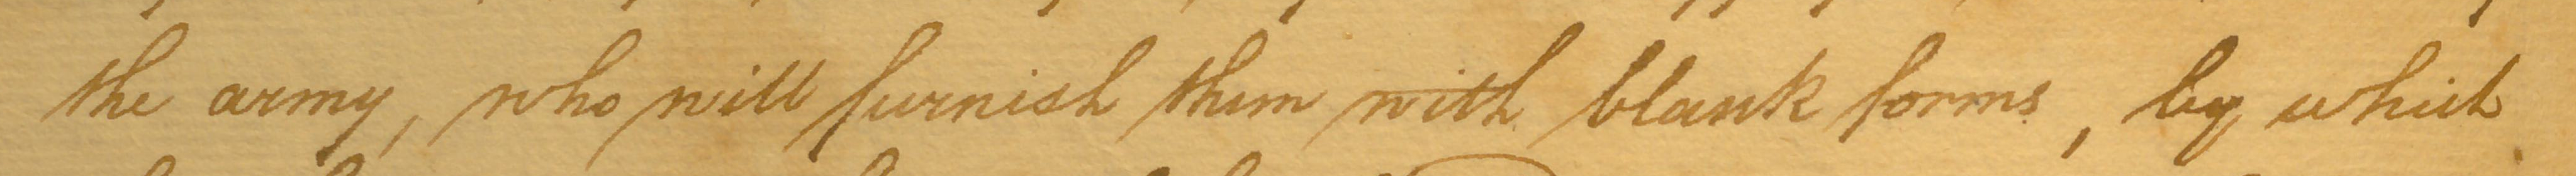the army, who will furnish them with blank forms, by which
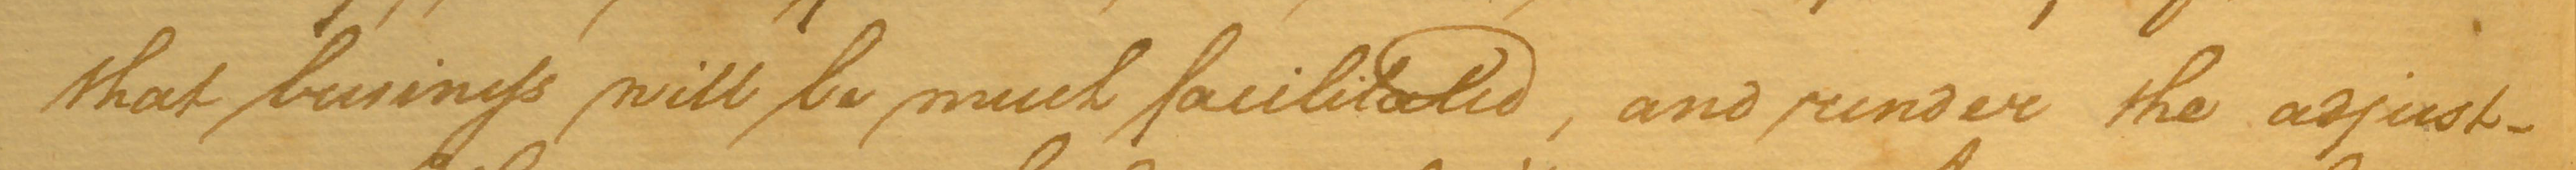that business will be much facilitated, and render the adjust-
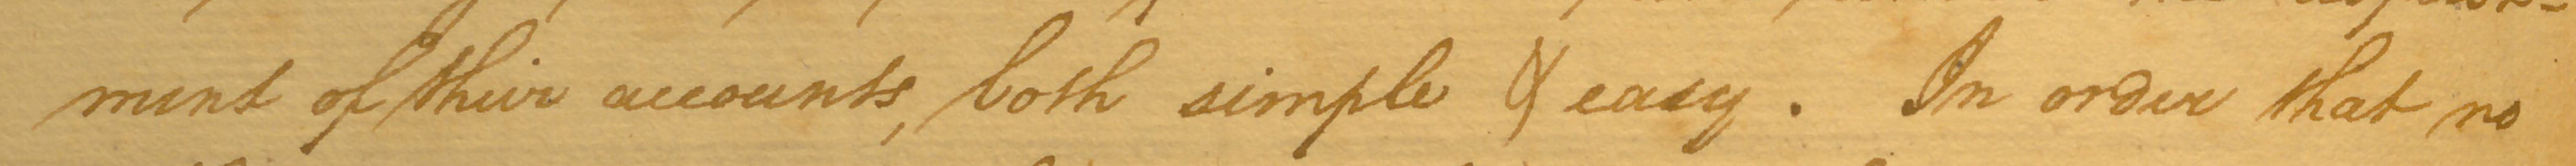ment of their accounts, both simple & easy. In order that no
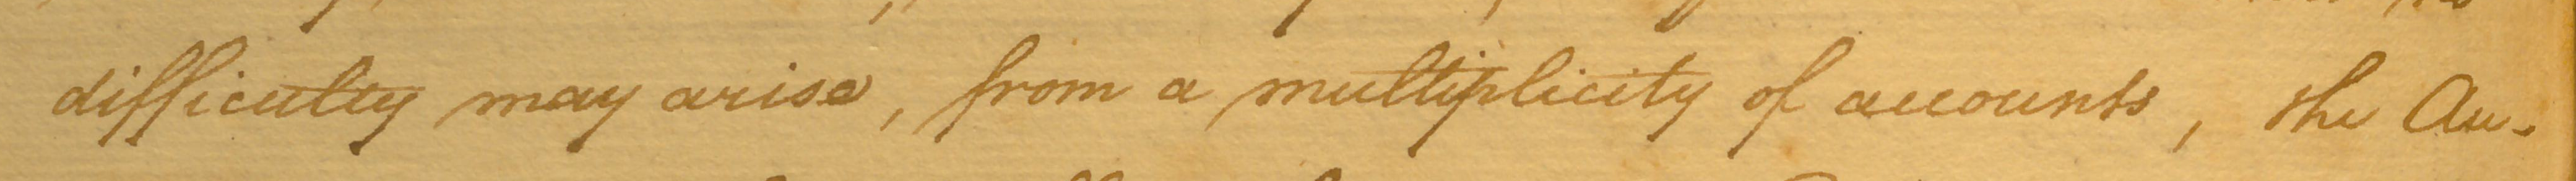difficulty may arise, from a multiplicity of accounts, the Au-
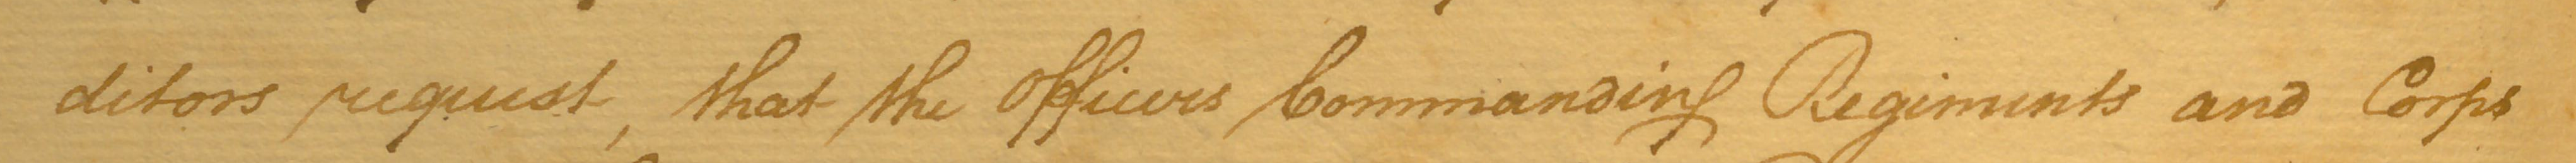ditors request, that the officers Commanding Regiments and Corps
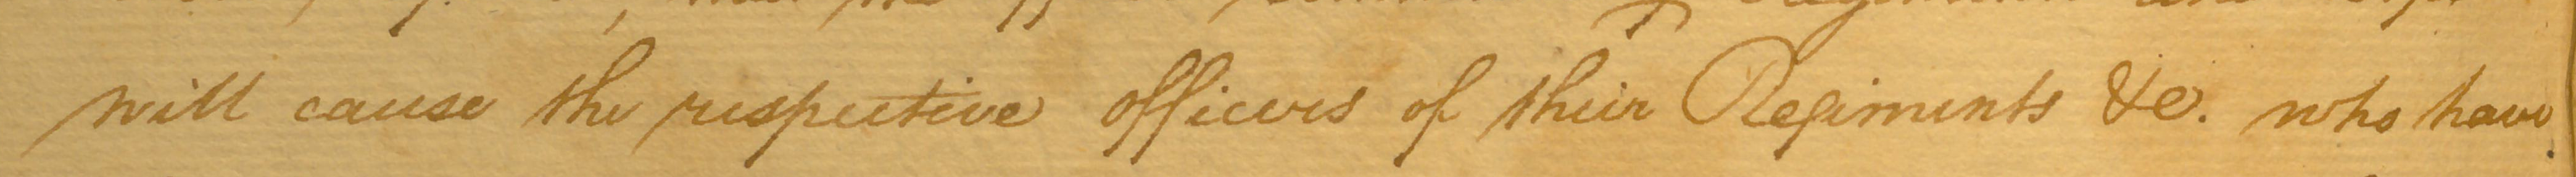will cause the respective officers of their Regiments &c. who have
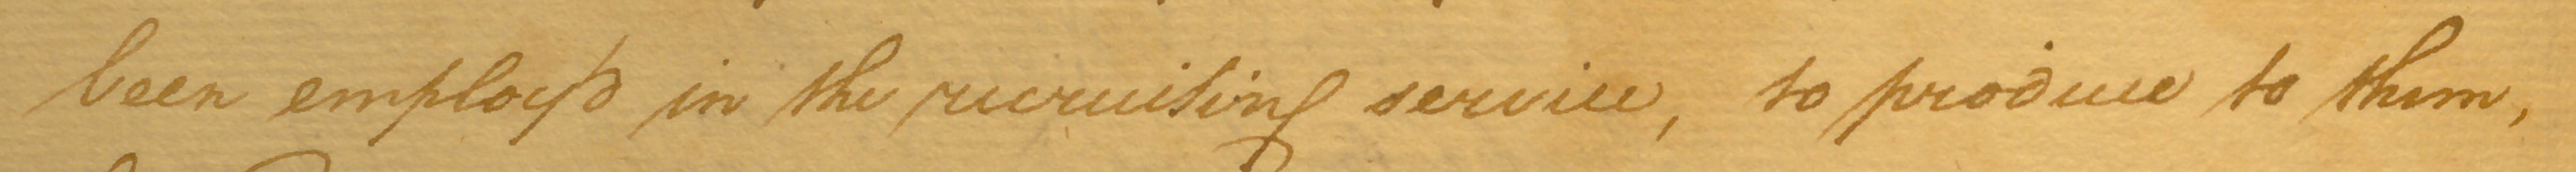been employ'd in the recruiting service, to produce to them,
